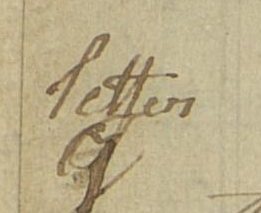letter
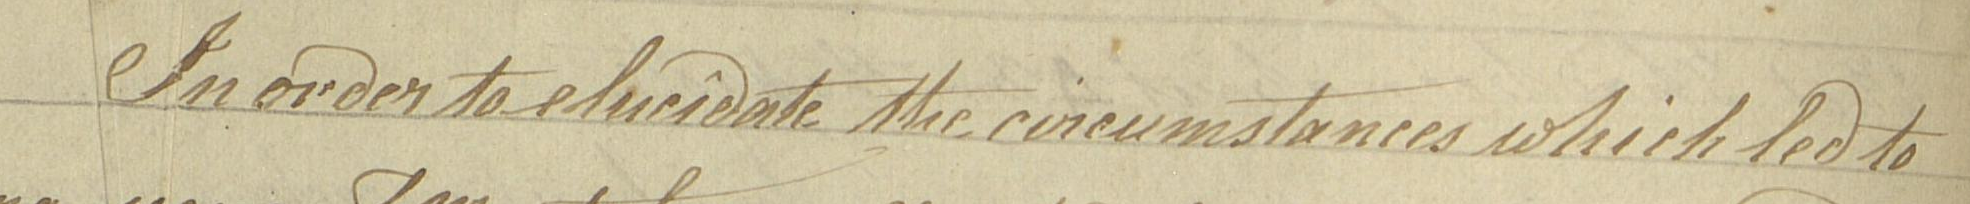In order to elucidate the circumstances which led to
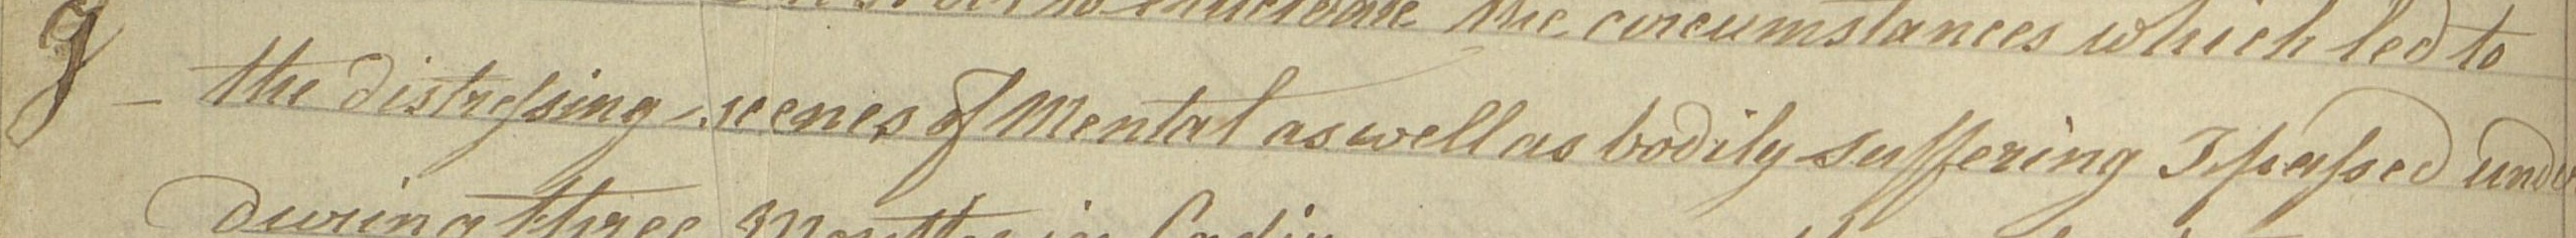J the distressing scenes of Mental as well as bodily suffering I passed under
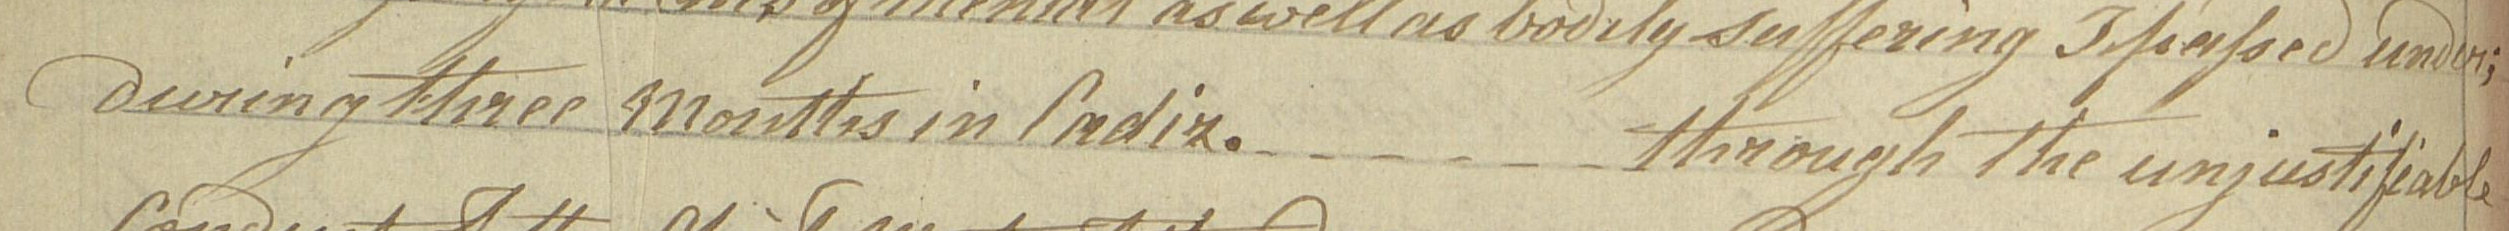during three months in Cadiz through the unjustifiable
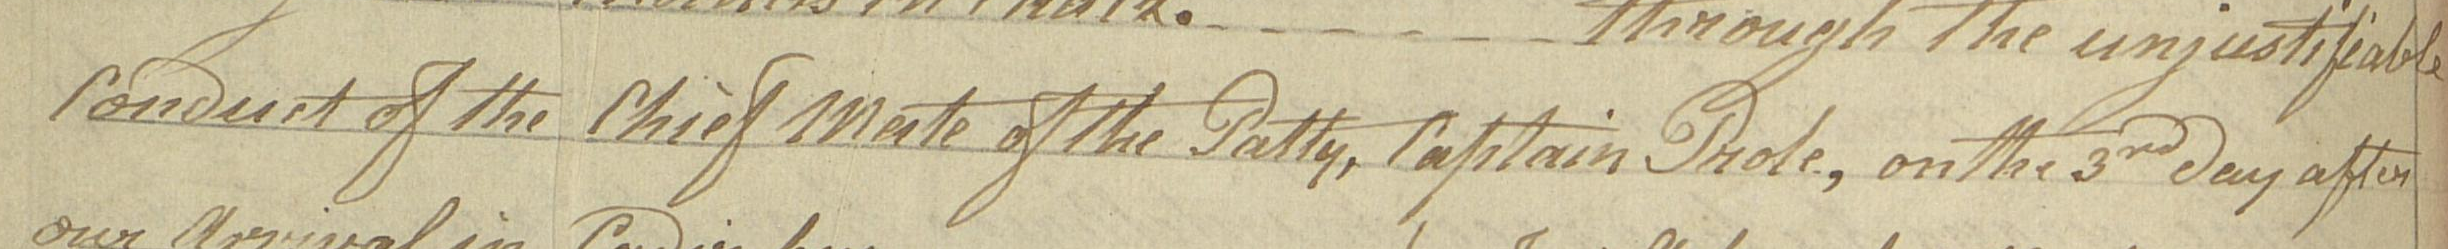Conduct of the Chief Mate of the Patty, Captain Prole, on the 3^rd day after
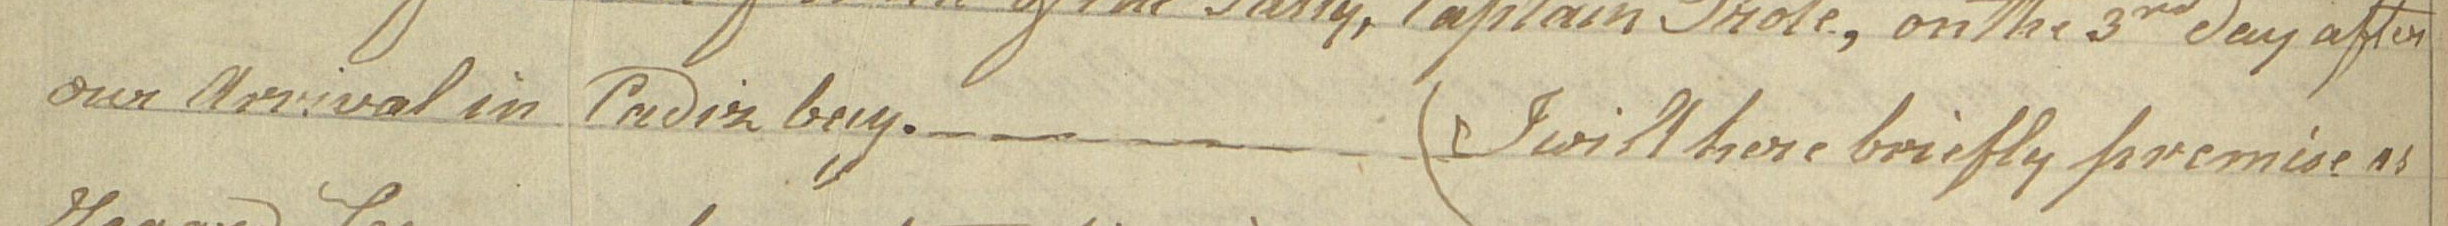our Arrival in Cadiz bay. (I will here briefly premise as
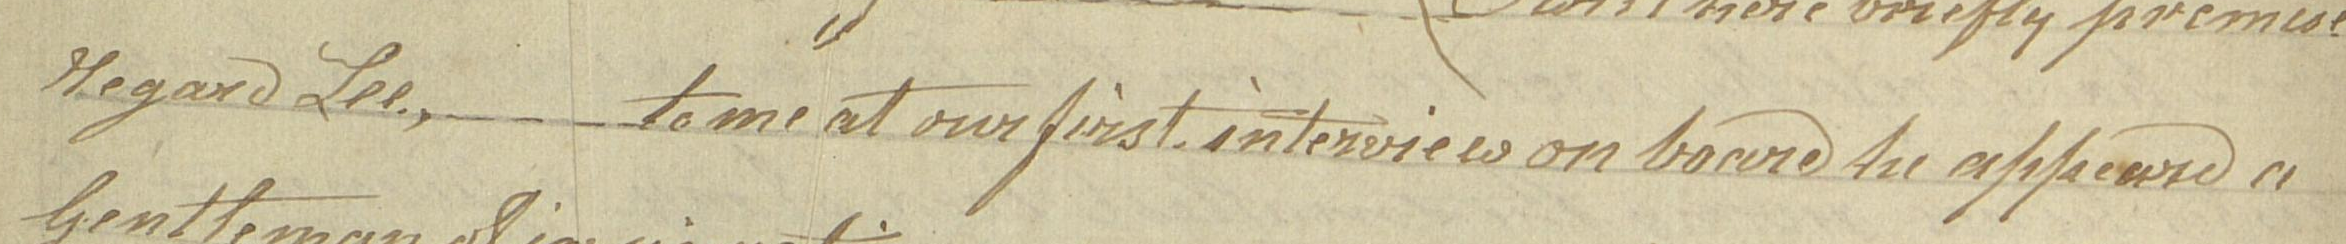Regard Lee, to me at our first interview on board he appeared a
